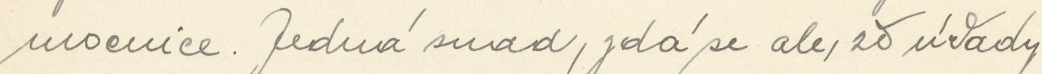mocnice. Jedná snad, zdá se ale, že úřady
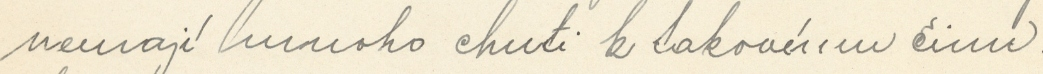nemají mnoho chuti k takovému činu.
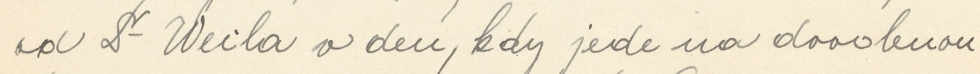od Dr Weila v den, kdy jede na dovolenou
